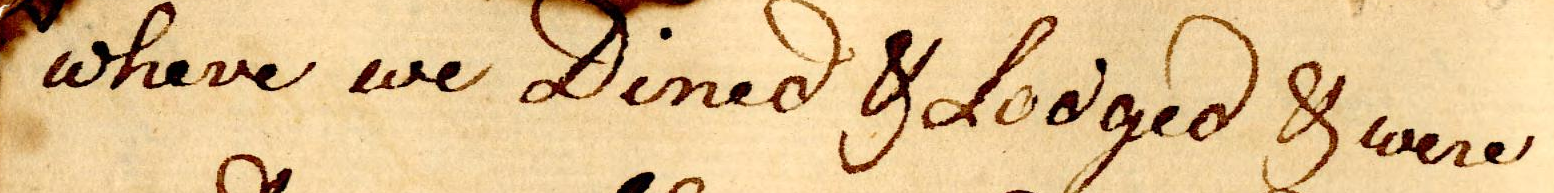where we Dined & Lodged & were
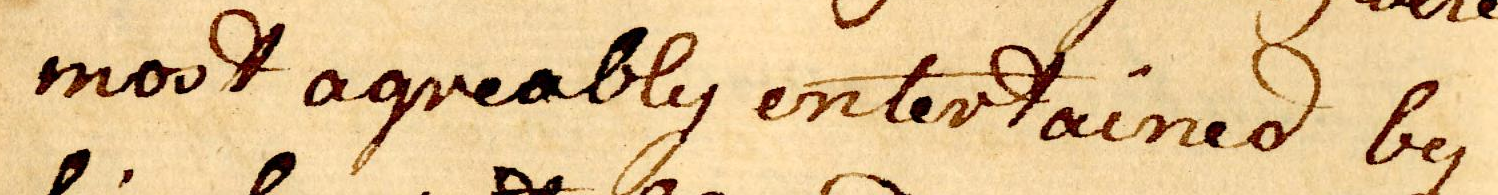most agreably entertained by
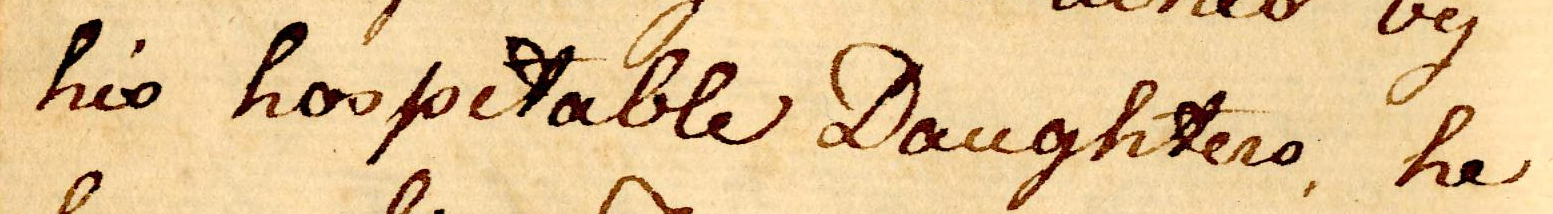his hospitable Daughters, he
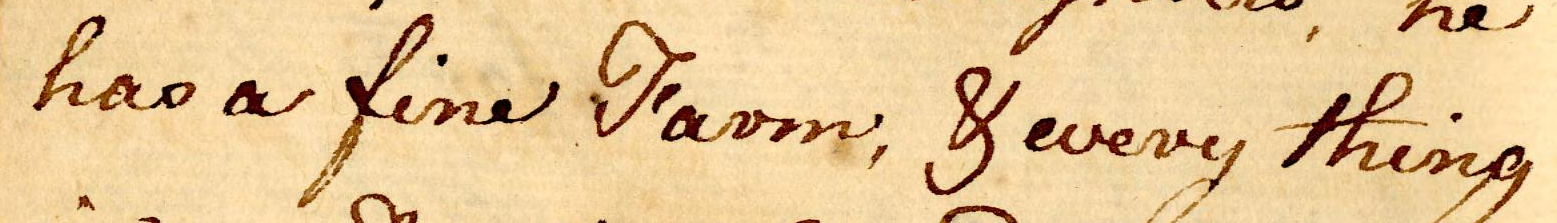has a fine Farm, & every thing
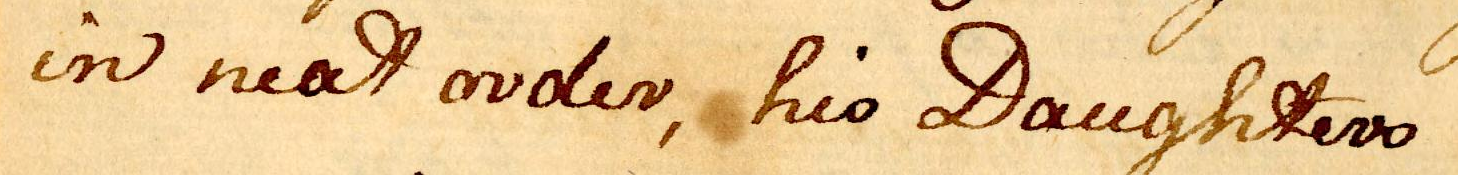in neat order, his Daughters
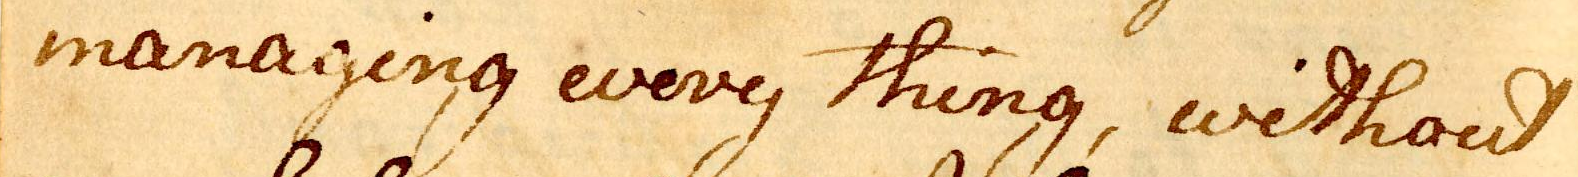managing every thing, without
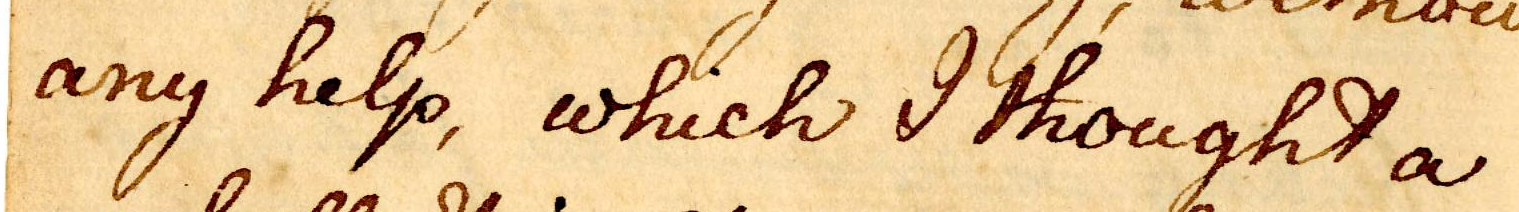any help, which I thought a
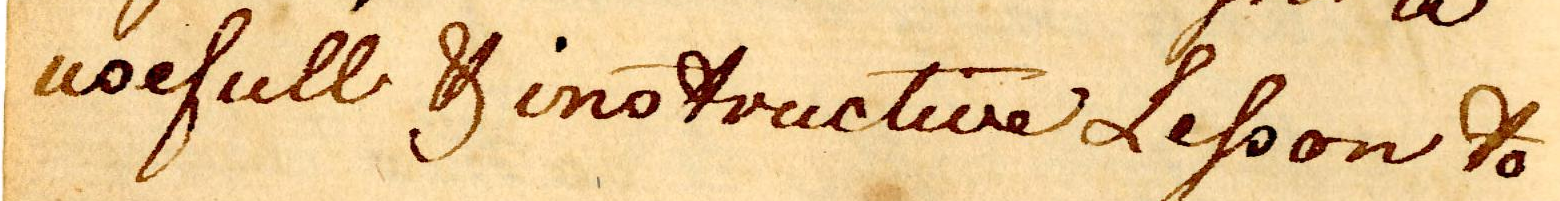usefull & instructive Lesson to
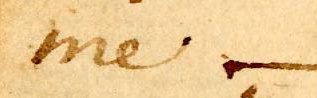me
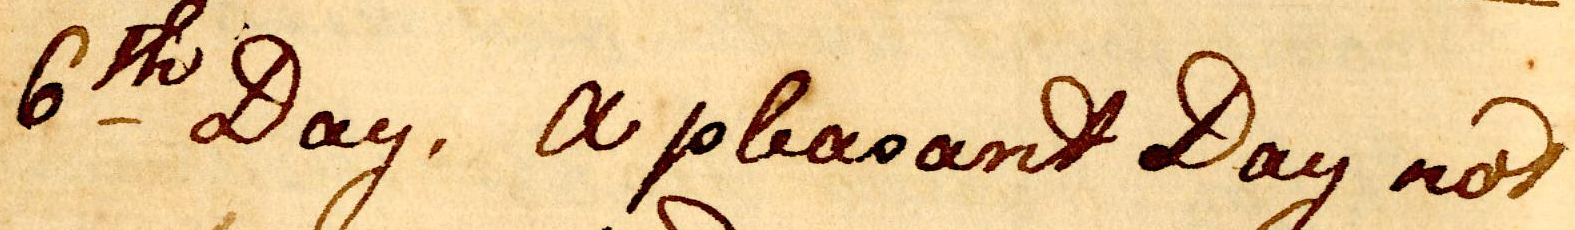6^th Day, A pleasant Day not
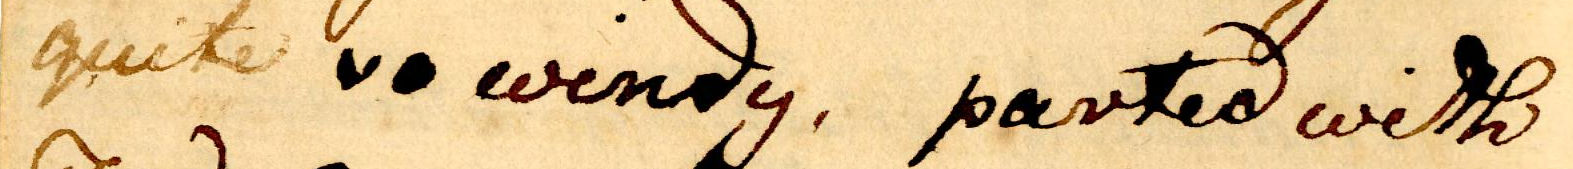quite so windy, parted with
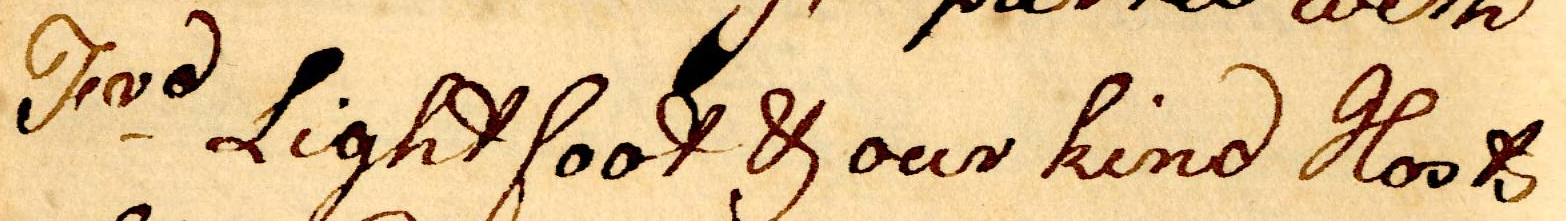F^rd Lightfoot & our kind Hosts
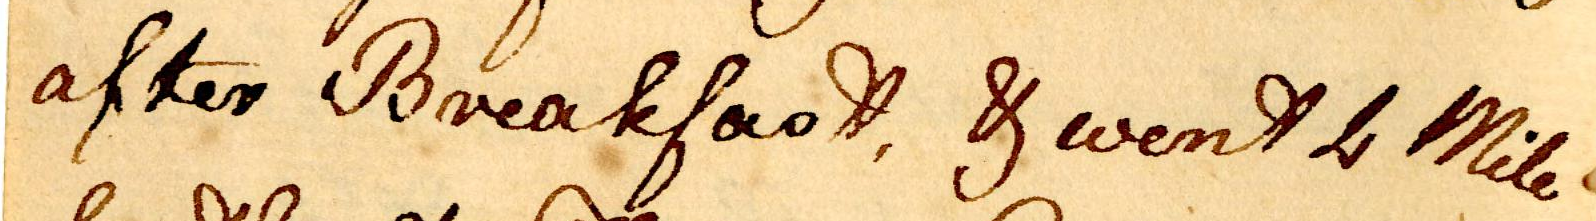after Breakfast, & went 4 Mile
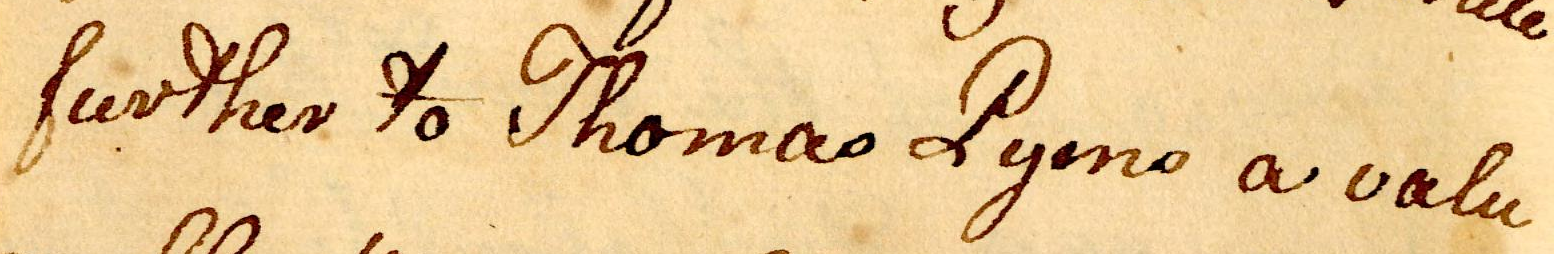further to Thomas Pyons a valu
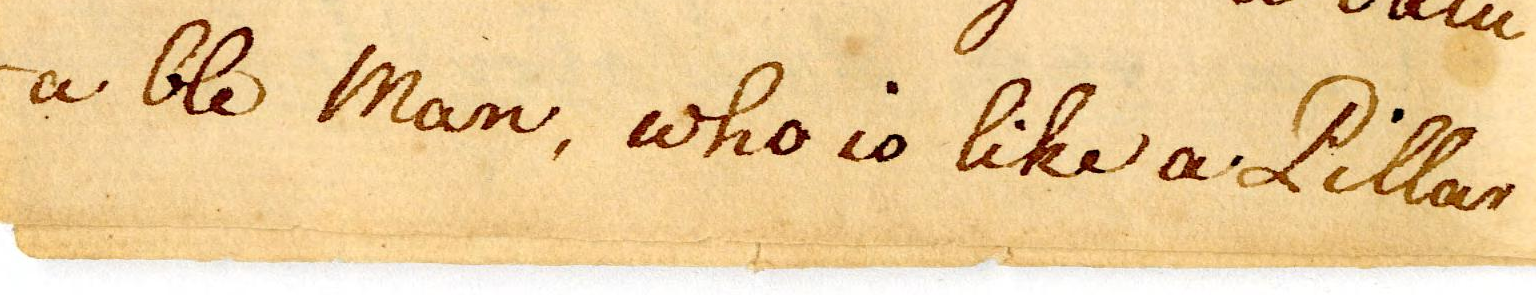-able Man, who is like a Pillar
